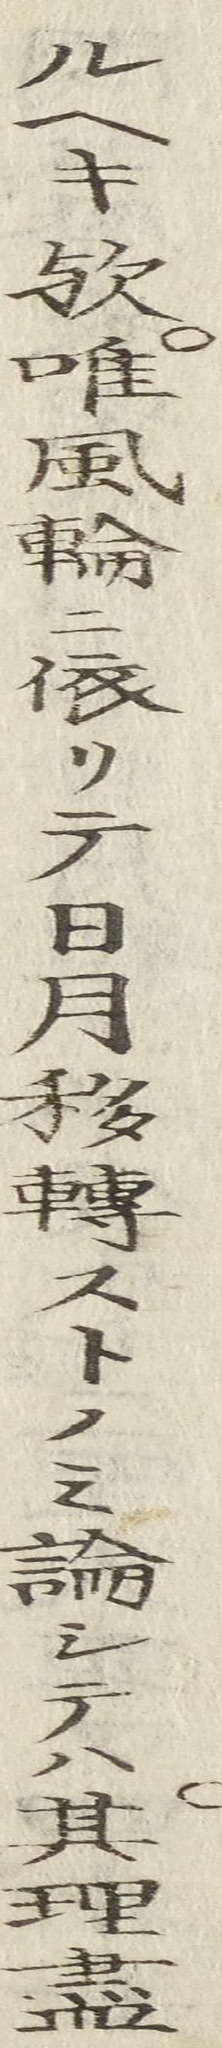ルヘキ欤。唯風輪ニ依リテ日月移転ストノミ論シテハ。其理尽
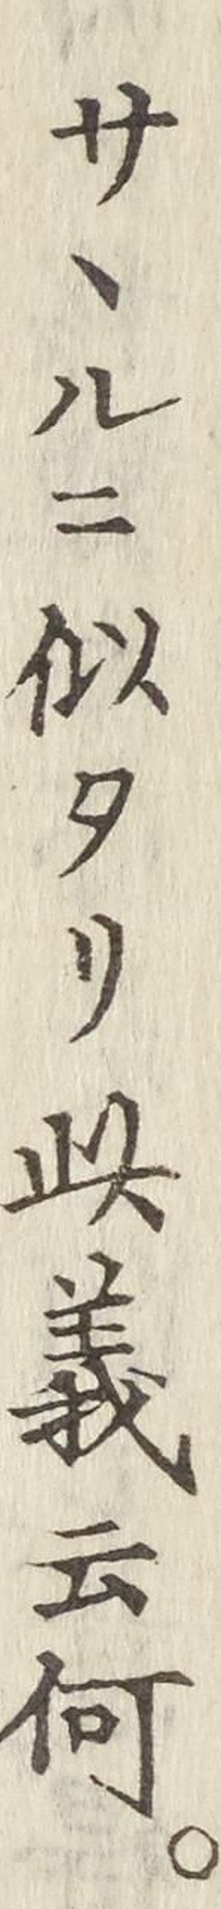サヽルニ似タリ此義云何。
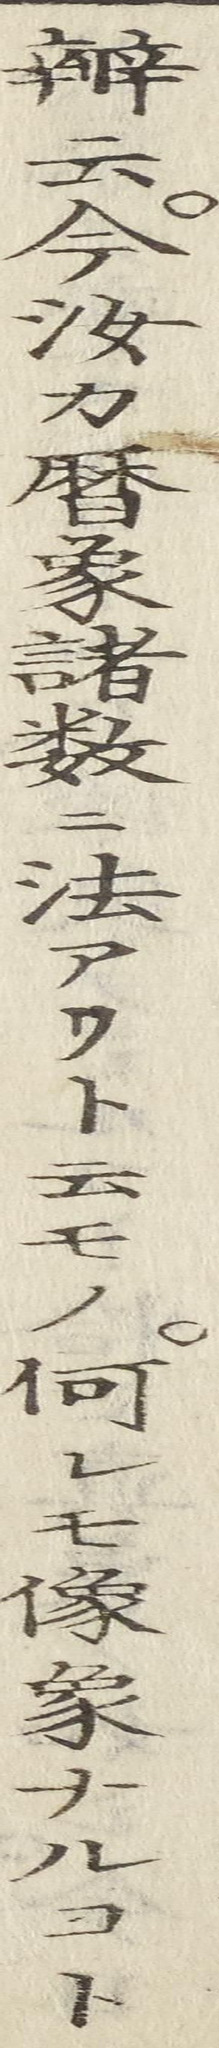弁云。今汝カ暦象諸数ニ法アリト云モノ。何レモ像象ナルコト
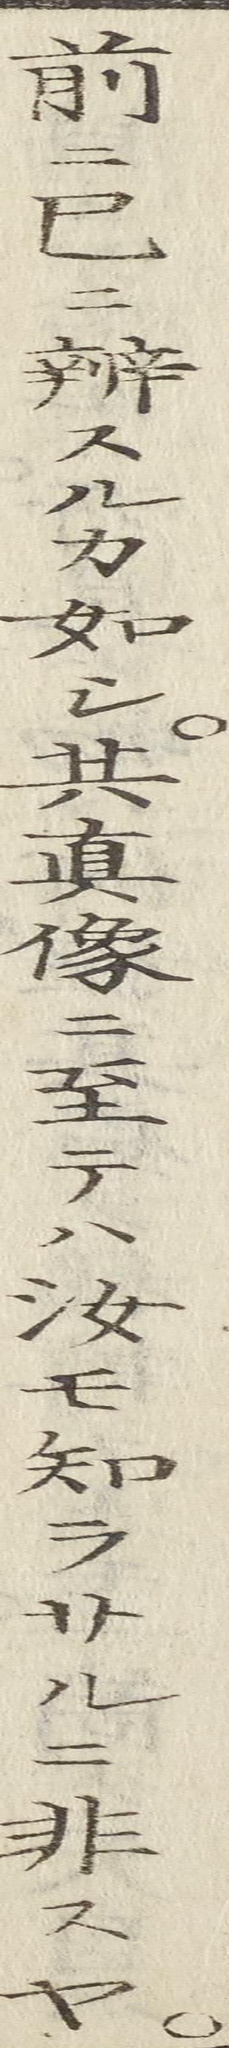前ニ已ニ弁スルカ如シ。其真像ニ至テハ汝モ知ラサルニ非スヤ。
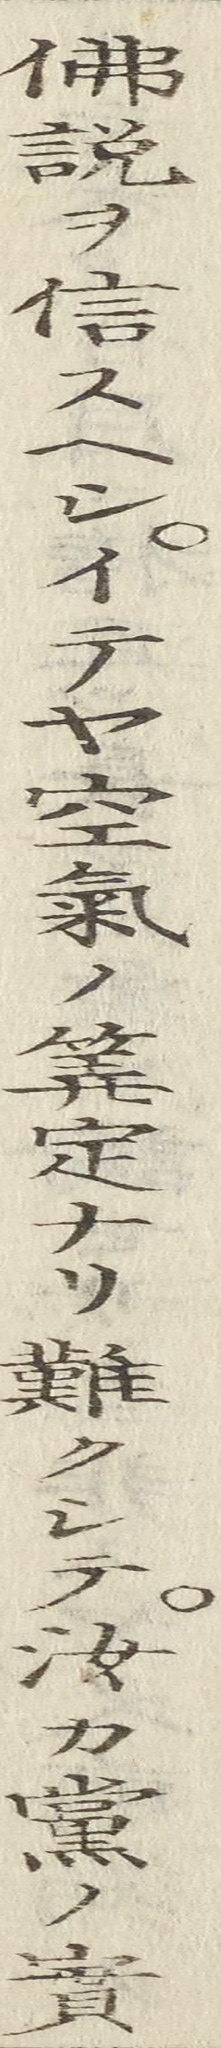仏説ヲ信スヘシ。イテヤ空気ノ筭定ナリ難クシテ。汝カ党ノ実
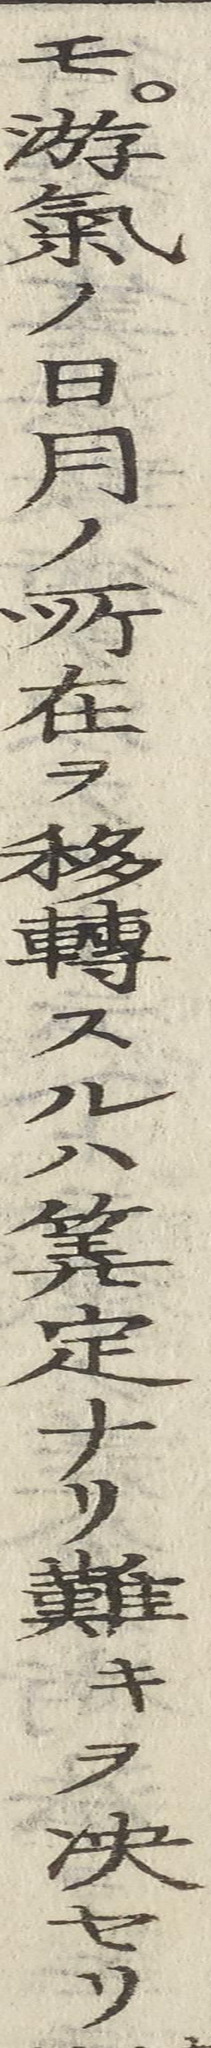モ。游気ノ日月ノ所在ヲ移転スルハ筭定ナリ難キヲ決セリ博物
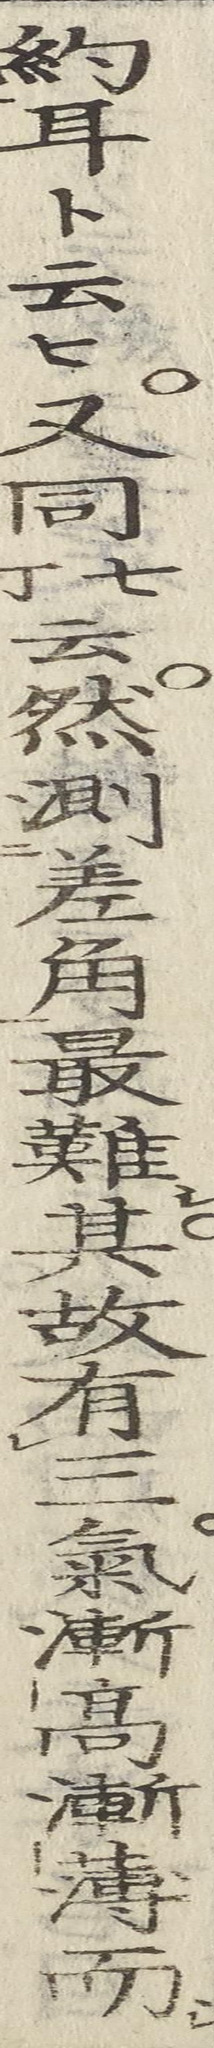約耳ト云ヒ。又同七丁云。然測ニ差角最難。其故有三。気漸ー高漸ー薄而
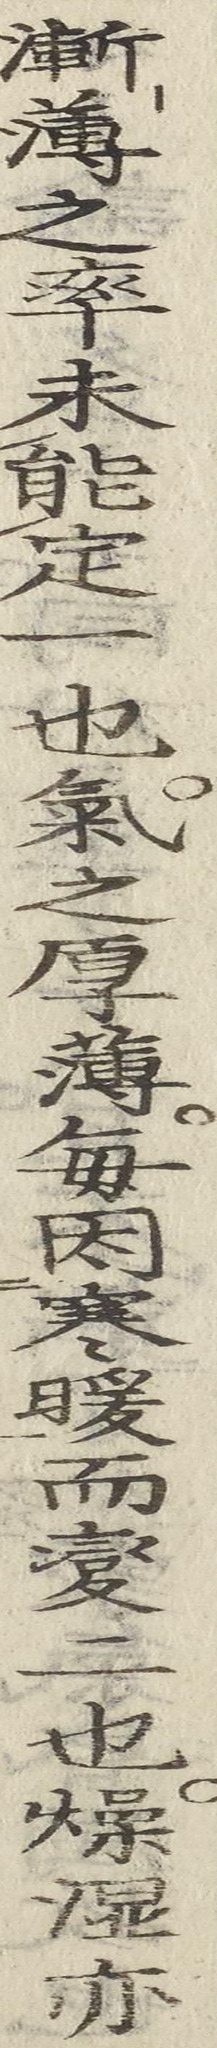漸薄之率未能定一也。気之厚薄。毎因ニ寒暖而変ニ也。燥湿亦

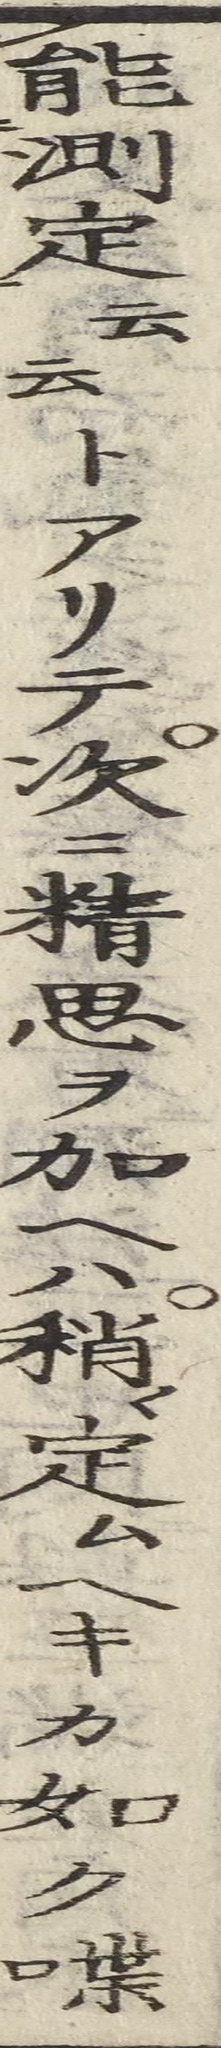能ニ測定云云トアリテ。次ニ精思ヲ加ヘハ。稍〱定ムヘキカ如ク喋
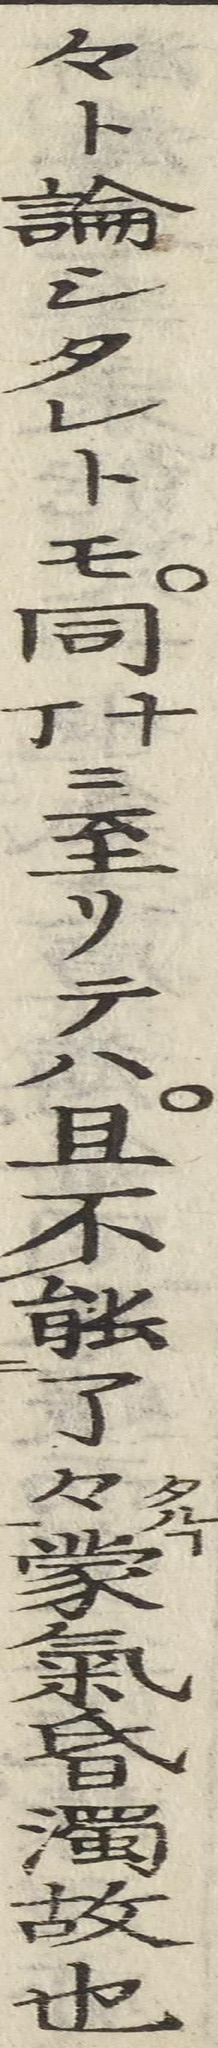々ト論シタレトモ。同十丁ニ至リテハ。且不能ニ了々蒙気昏濁故也
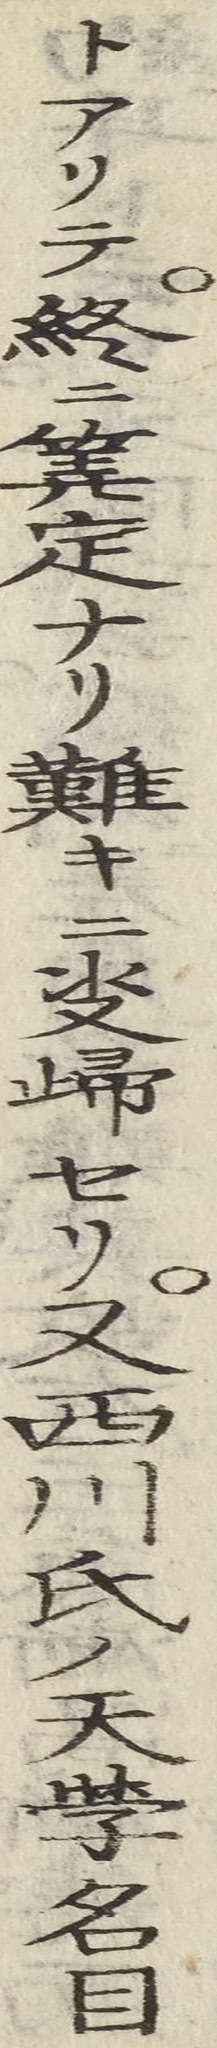トアリテ。終ニ筭定ナリ難キニ決帰セリ。又西川氏ノ天学名目
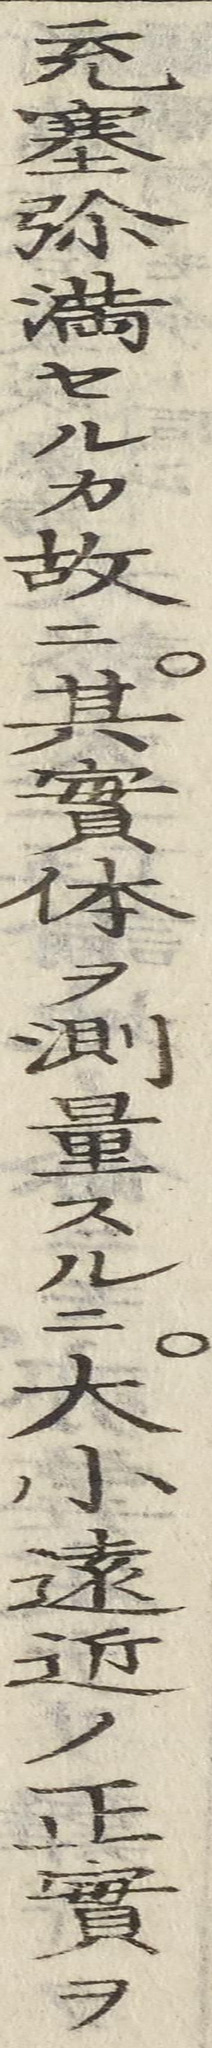充塞弥満セルカ故ニ。其実体ヲ測量スルニ。大小遠近ノ正実ヲ
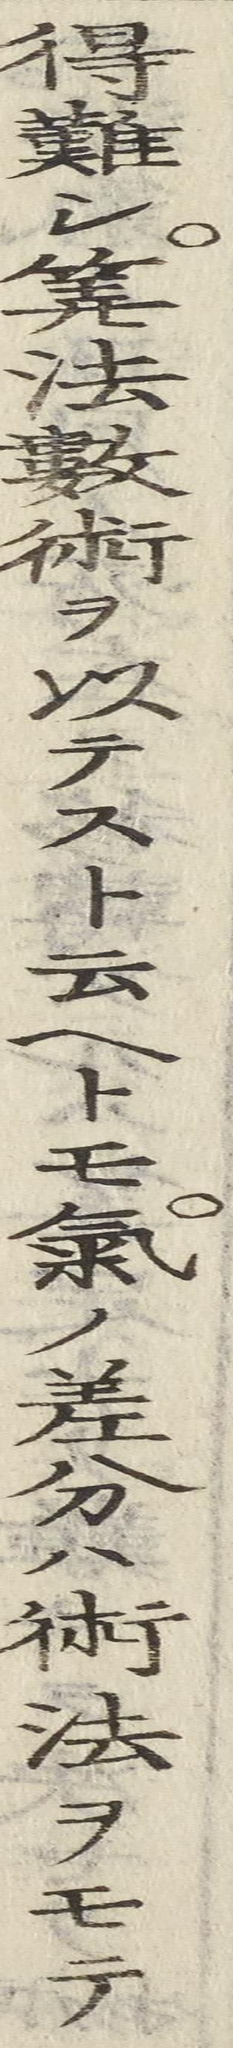得難シ。筭法数術ヲ以テスト云ヘトモ。気ノ差分ハ術法ヲモテ
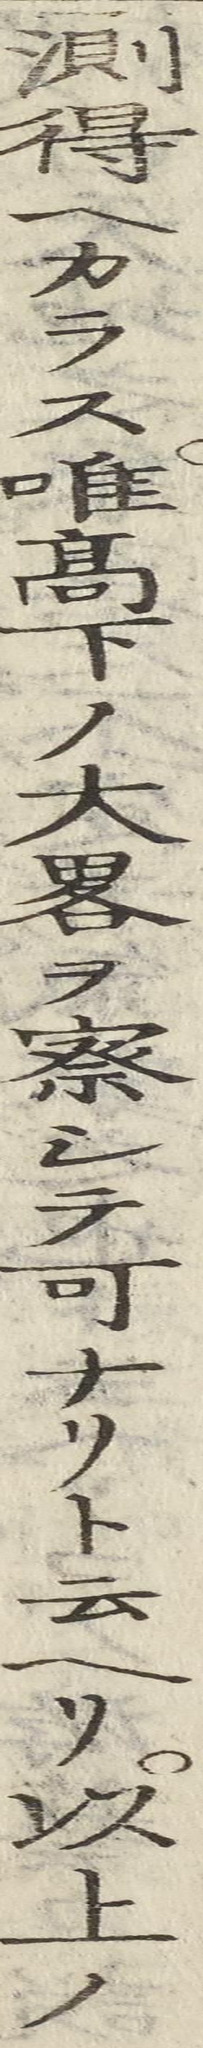測得ヘカラス。唯高下ノ大略ヲ察シテ可ナリト云ヘリ。以上ノ
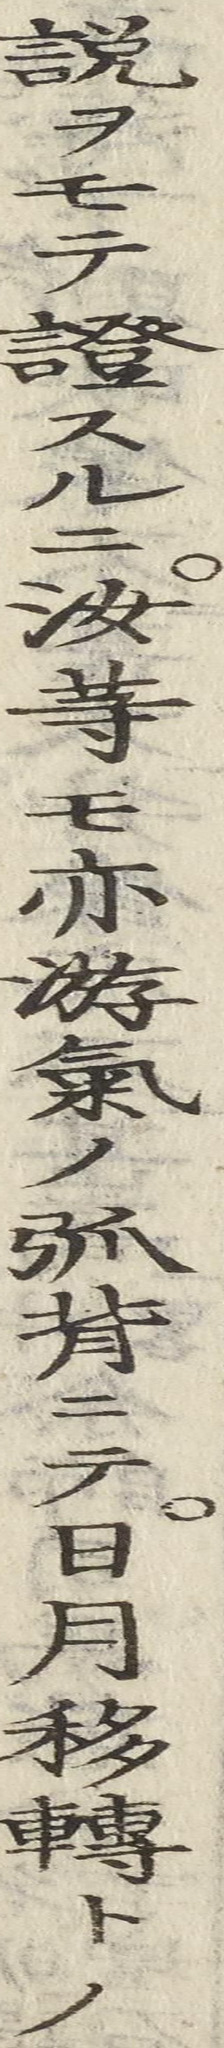説ヲモテ証スルニ。汝等モ亦游気ノ弧背ニテ。日月移転トノ
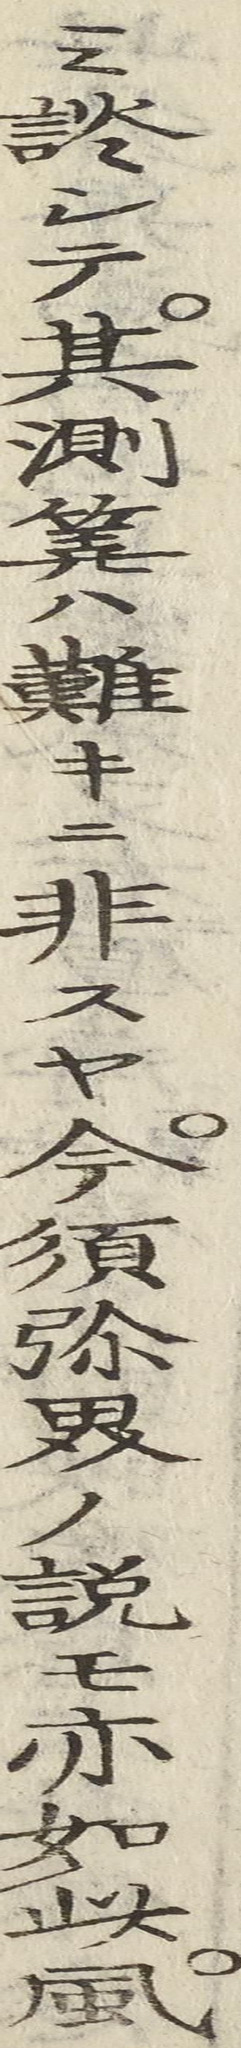ミ談シテ。其測筭ハ難キニ非スヤ。今須弥界ノ説モ亦如此。風
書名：護法新論　二編　上
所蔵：東京大学地震研究所図書室 Earthquake Research Institute Library, The University of Tokyo, JAPAN
